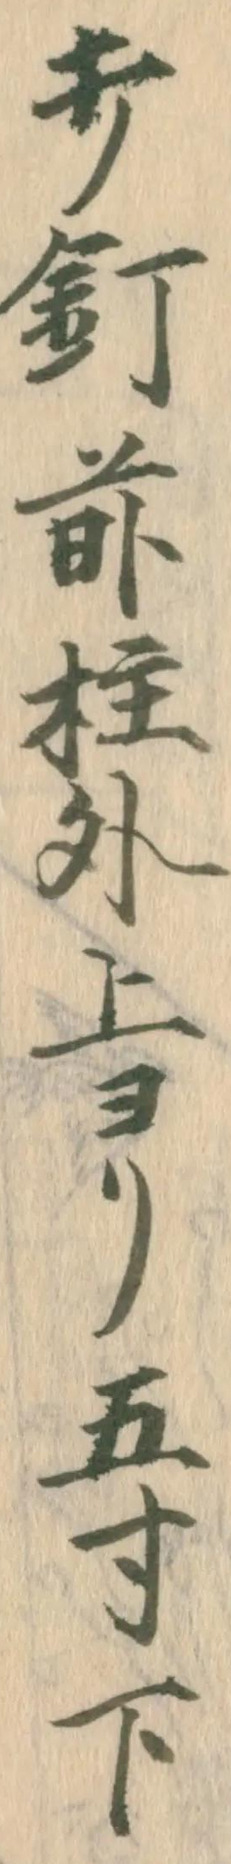打釘前柱外上ヨリ五寸下
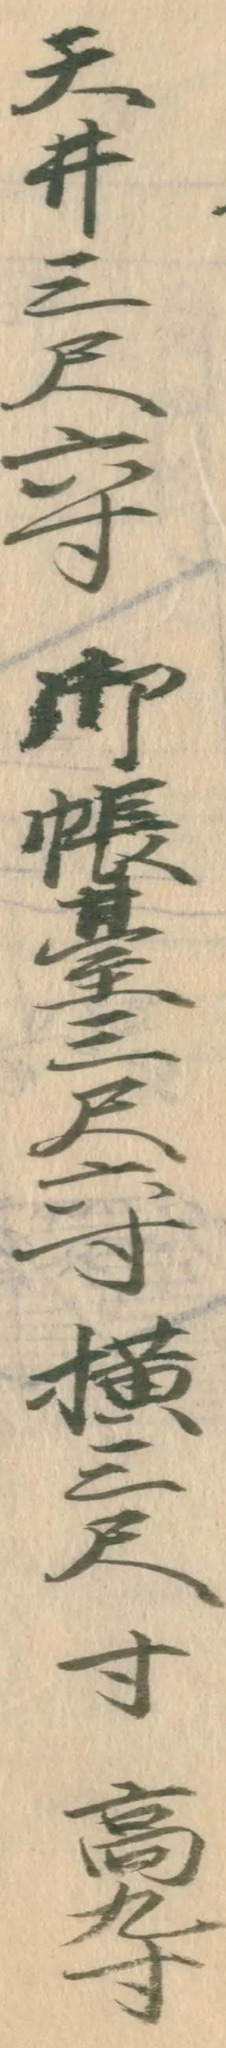天井三尺六寸御帳台三尺六寸横三尺寸高九寸
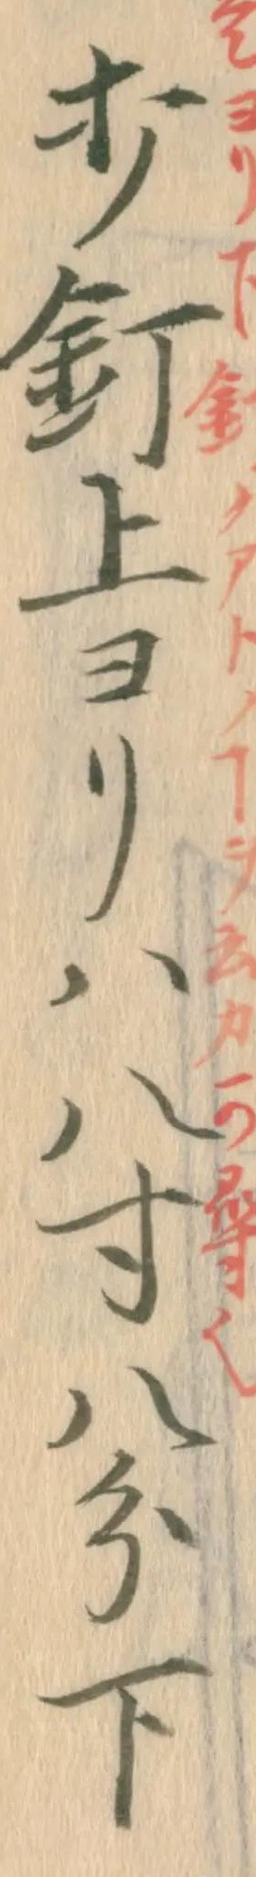打釘上ヨリハ八寸八分下
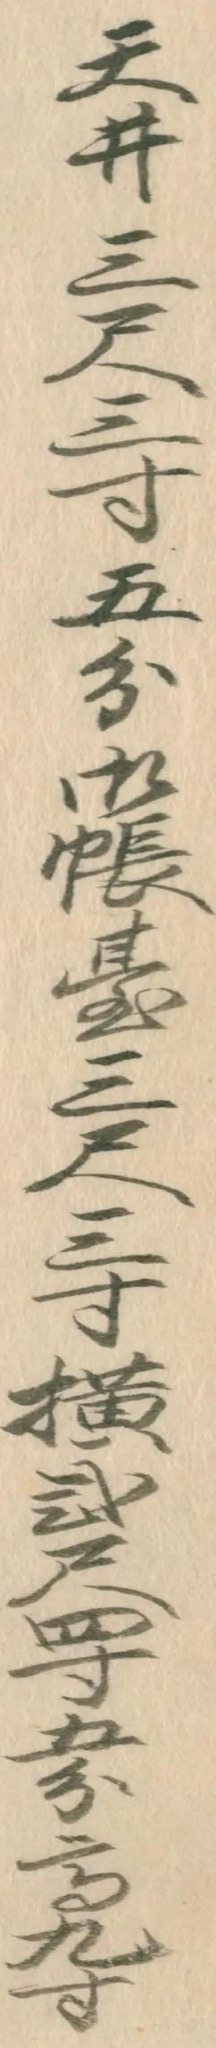天井三尺三寸五分御帳台三尺三寸横弐尺四寸五分高九寸
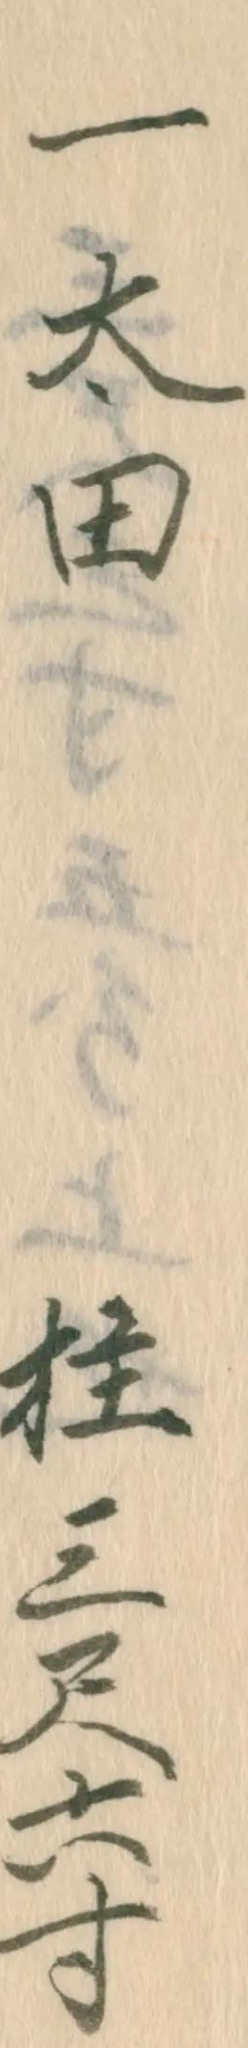一太田柱三尺六寸
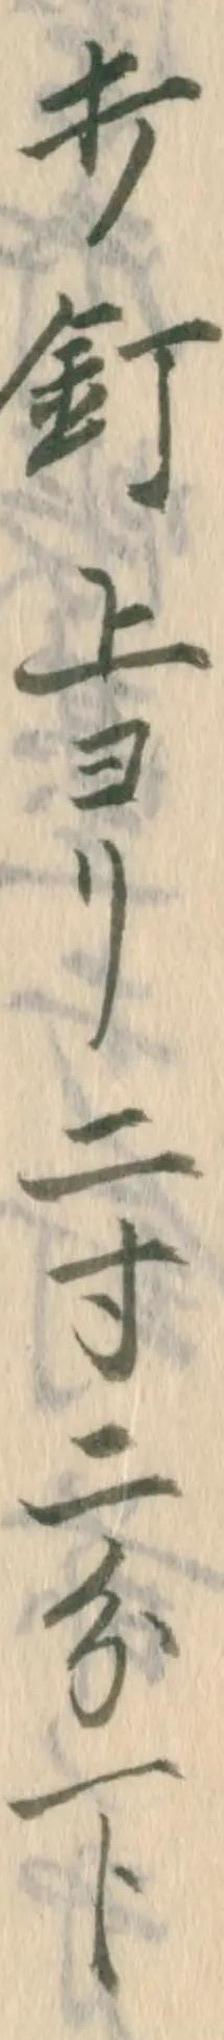打釘上ヨリ二寸二分下
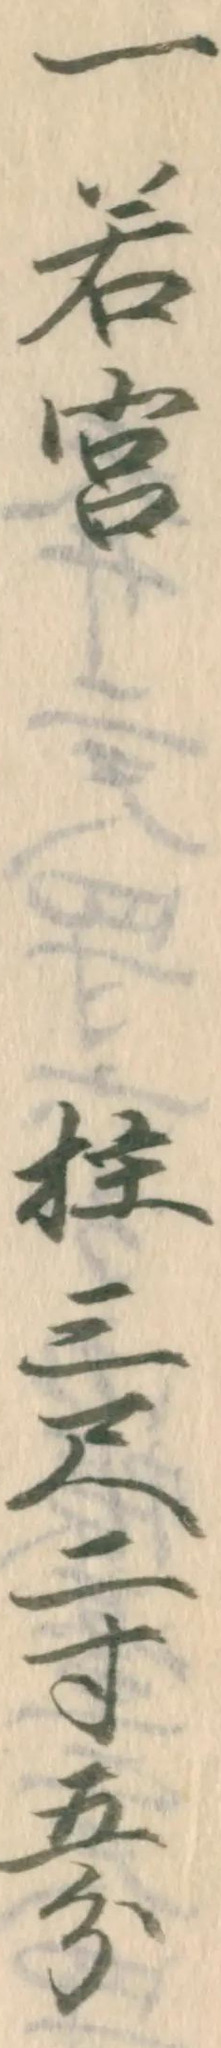一若宮柱三尺二寸五分
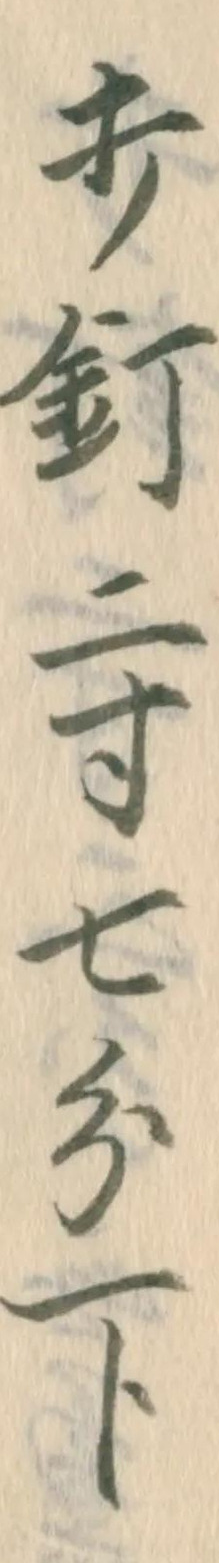打釘二寸七分下
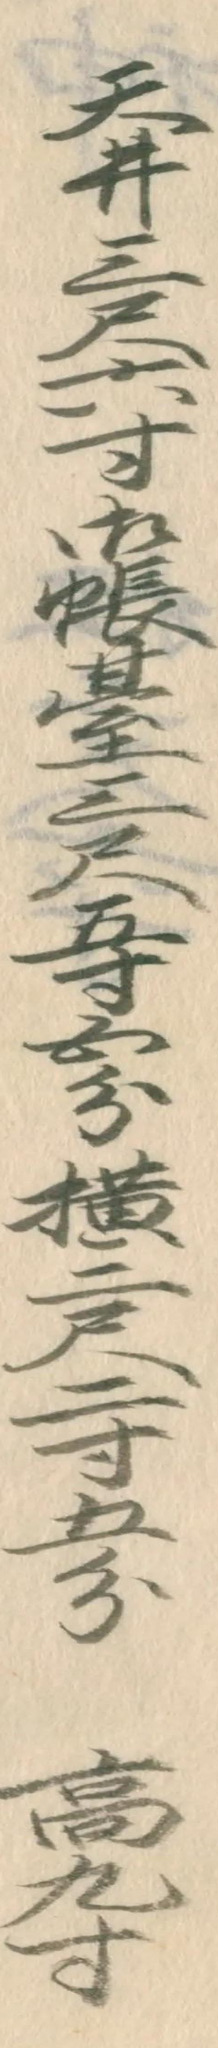天井三尺六寸御帳台三尺五寸五分横二尺二寸五分高九寸
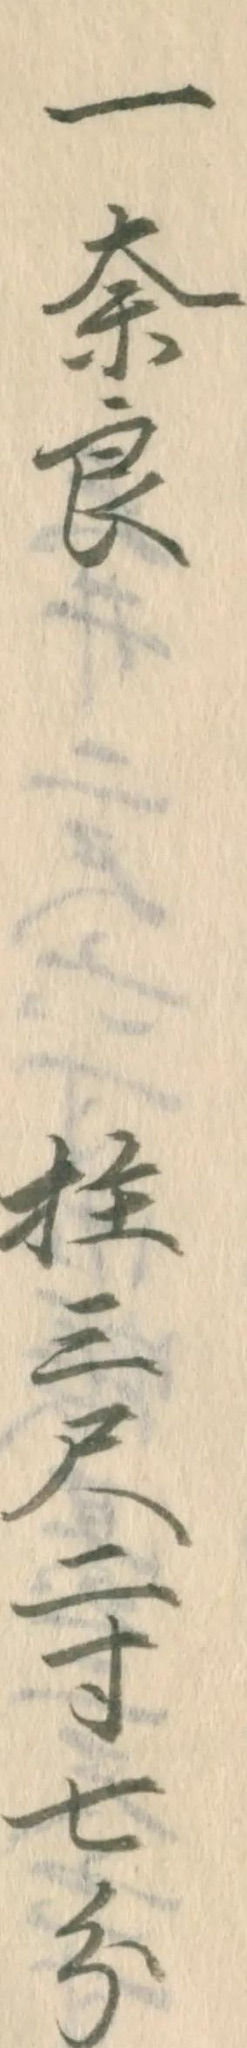一奈良柱三尺二寸七分
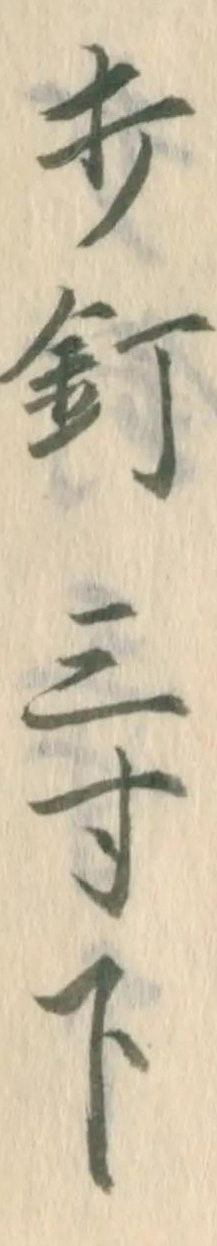打釘三寸下
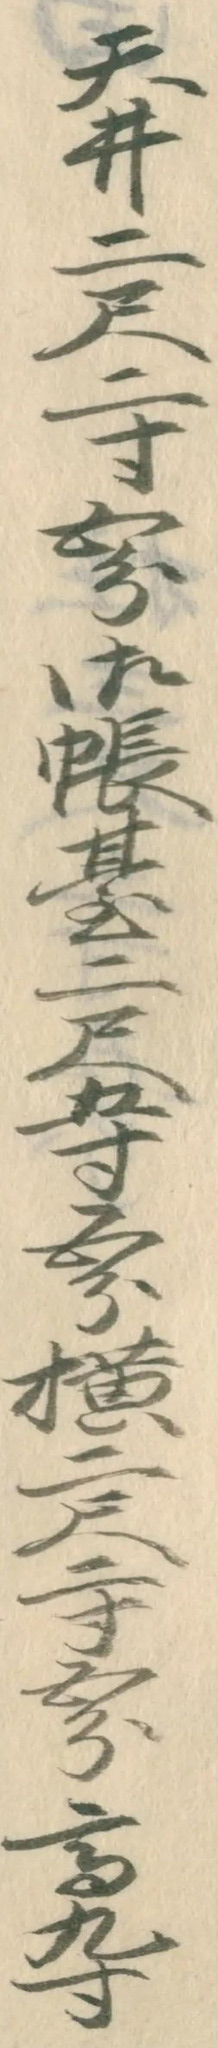天井二尺二寸五分御帳台二尺五寸五分横二尺二寸五分高九寸

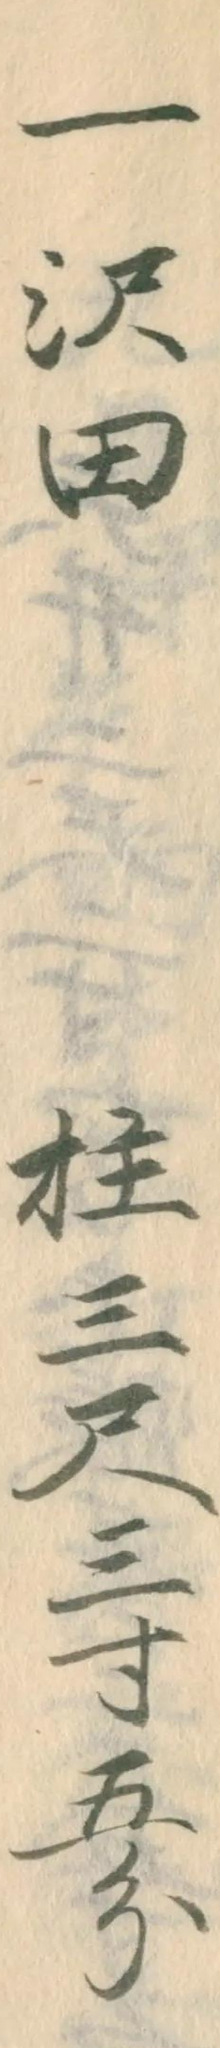一沢田柱三尺三寸五分
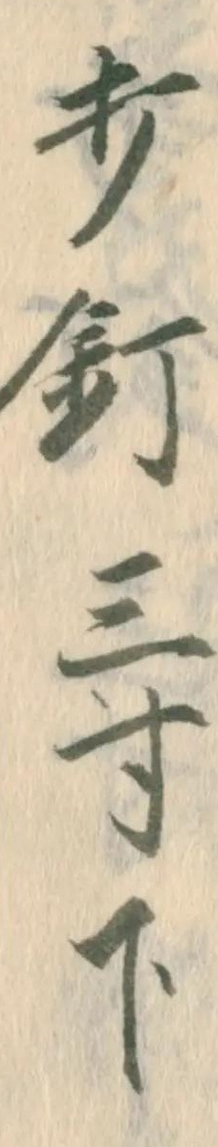打釘三寸下
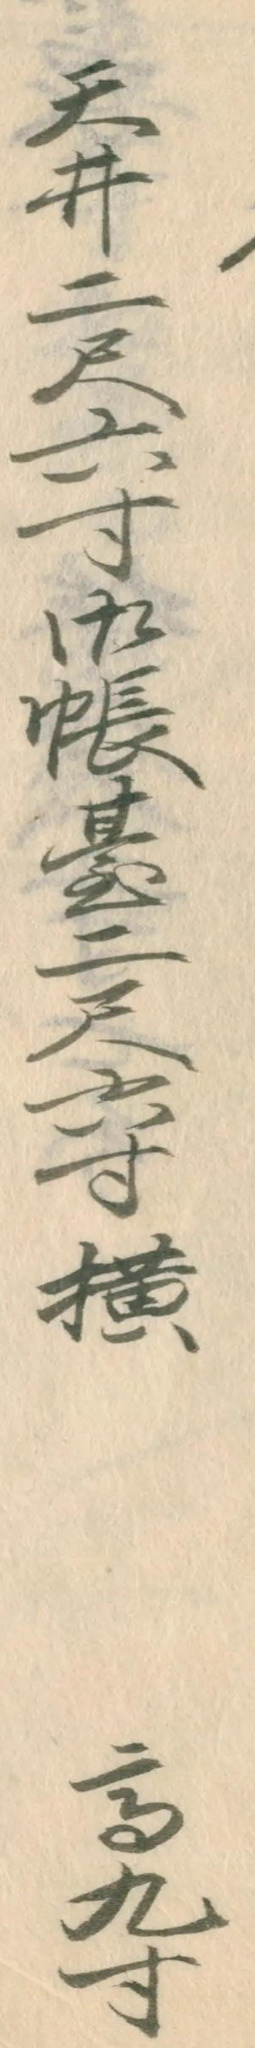天井二尺六寸御帳台二尺六寸横高九寸
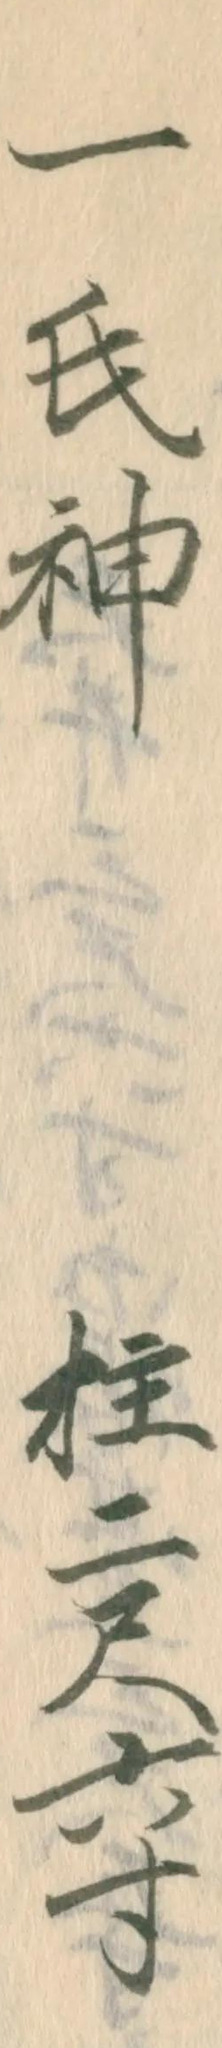一氏神柱二尺六寸
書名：賀茂社記録. 第16冊
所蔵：国立国会図書館 National Diet Library, JAPAN
